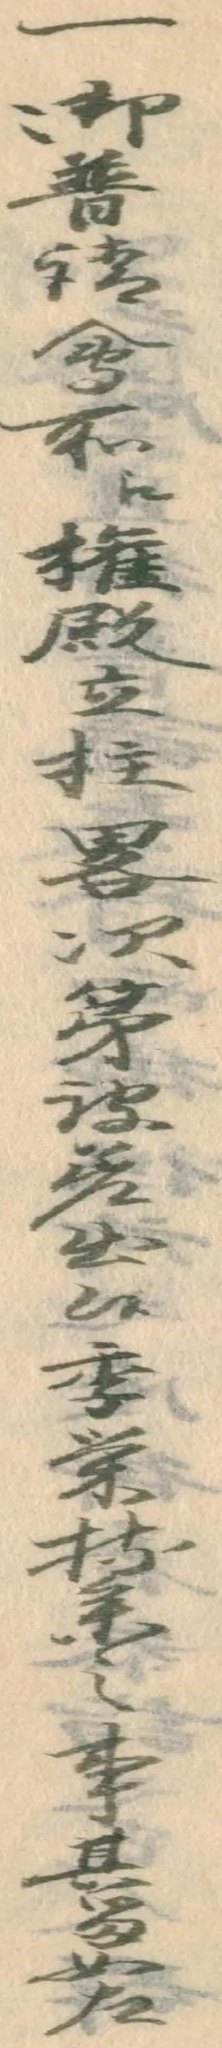一御普請会所江権殿立柱略次第被差出候季栄持参之事其留如左
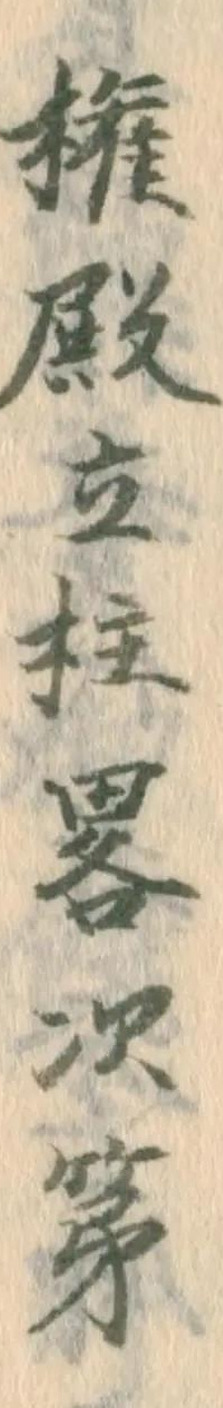権殿立柱略次第
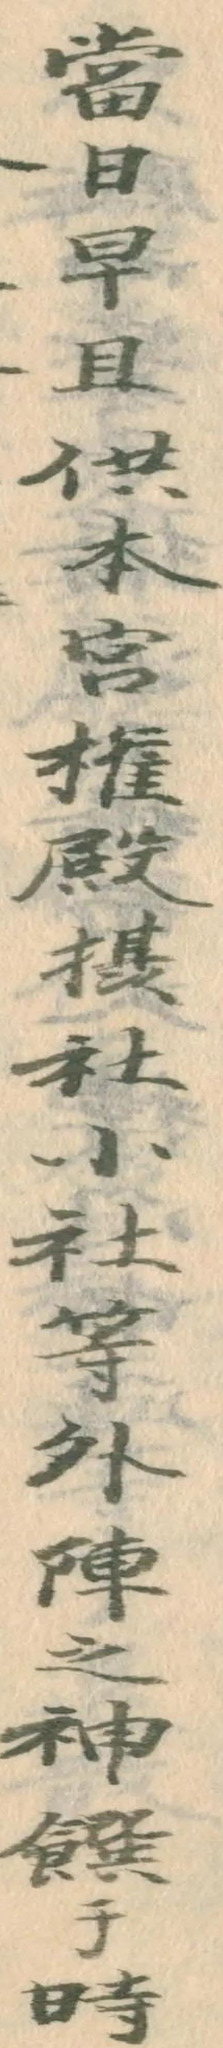当日早且供本宮権殿摂杜小社等外陣之神饌于時
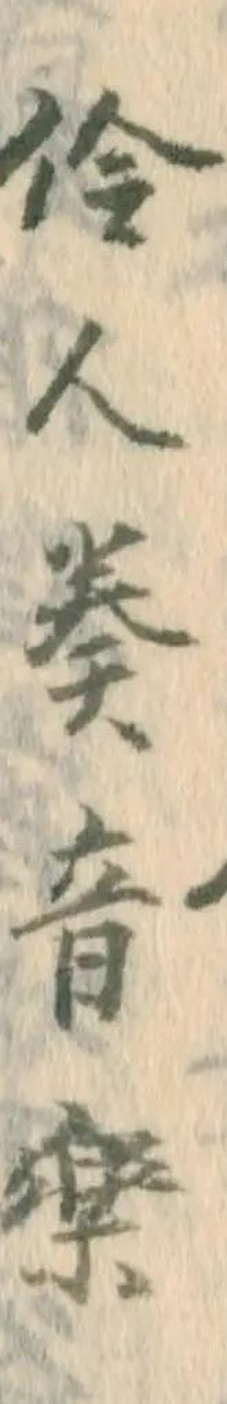伶人奏音楽

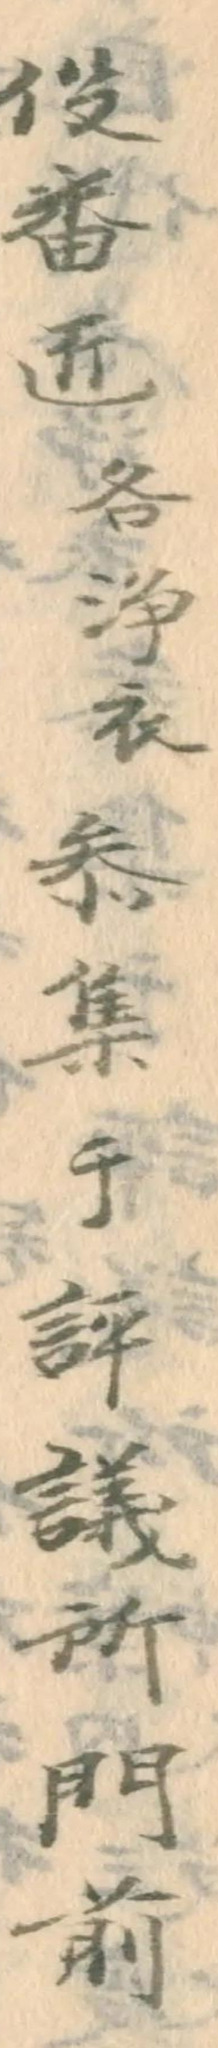役番匠各浄衣参集于評議所門前
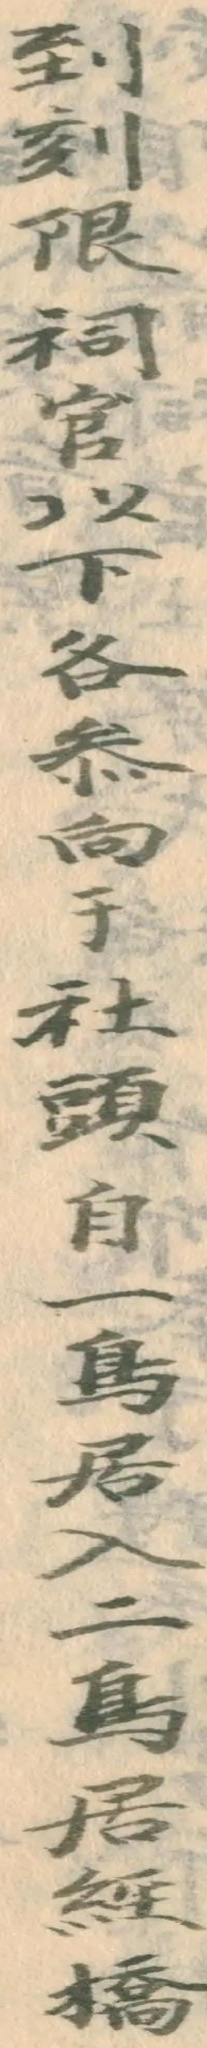到刻限祠官以下各参向于社頭自一鳥居入二鳥居経橋
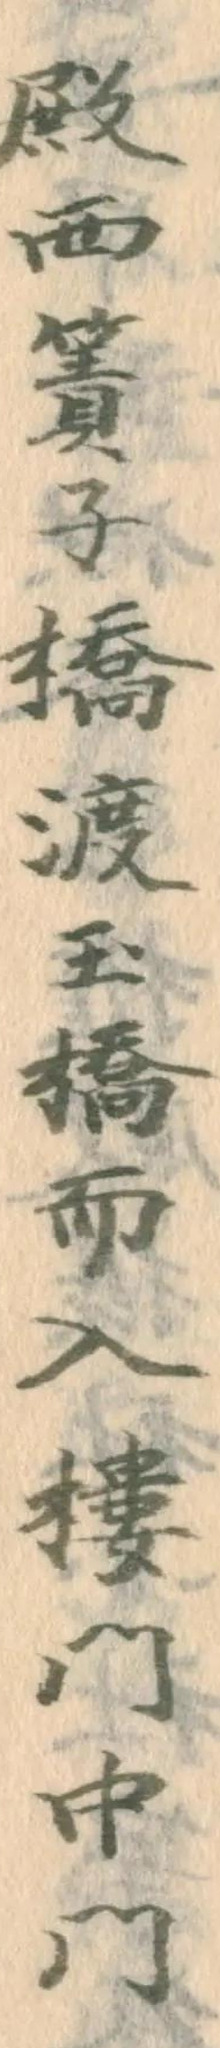殿西簀子橋渡玉橋而入楼門中門
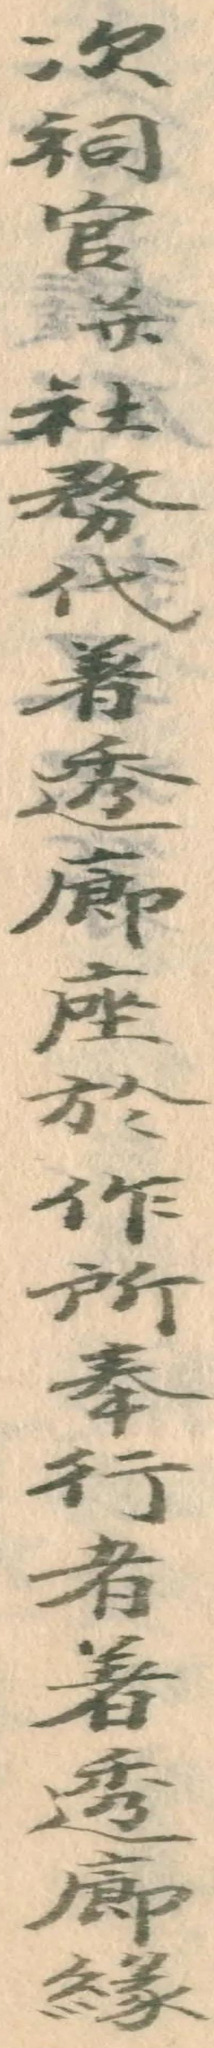次祠官并社務代着透廊座於作所奉行は着透廊縁
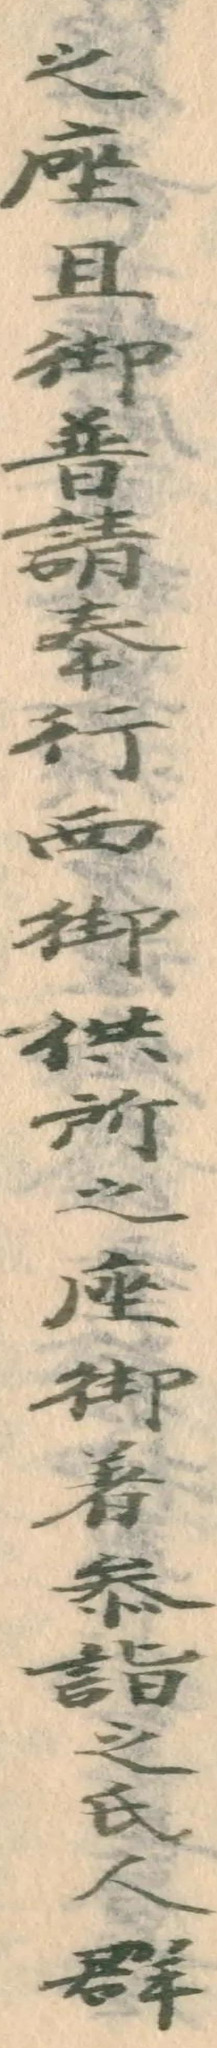之座且御普請奉行西御供所之座御着参詣之氏人群
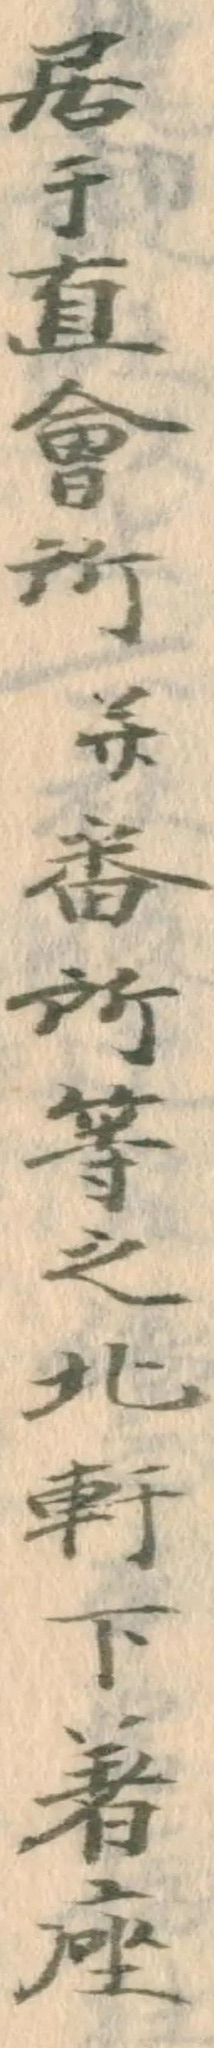居于直会所并番所等之北軒下着座
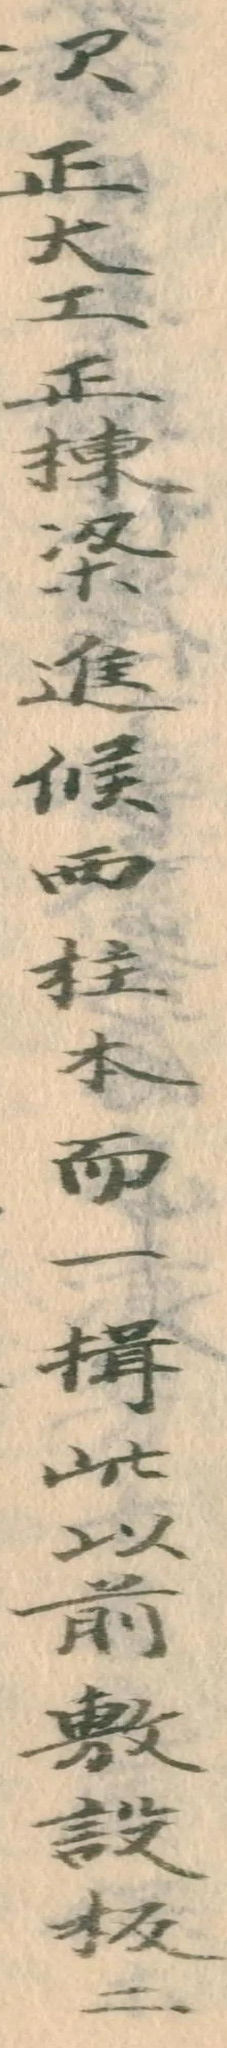次正大工正棟梁進候西柱木而一揖此以前敷設板二
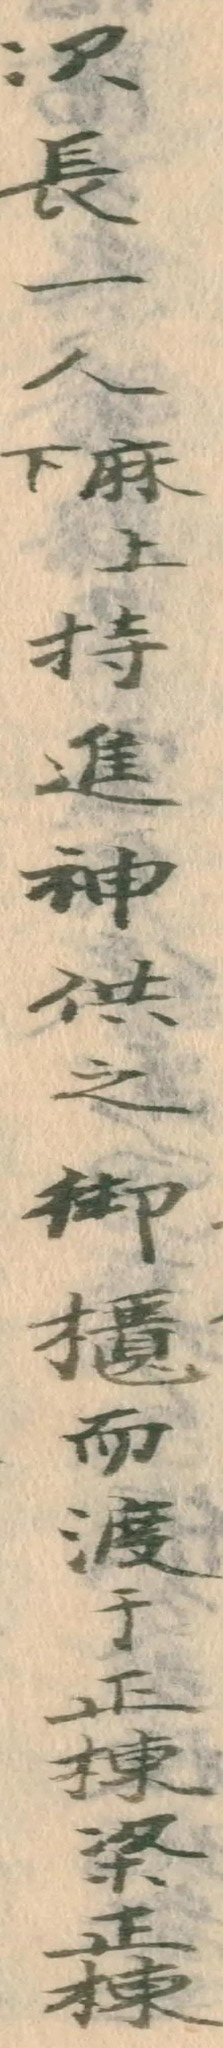次長一人麻上下持進神供之御櫃而渡于正棟梁正棟
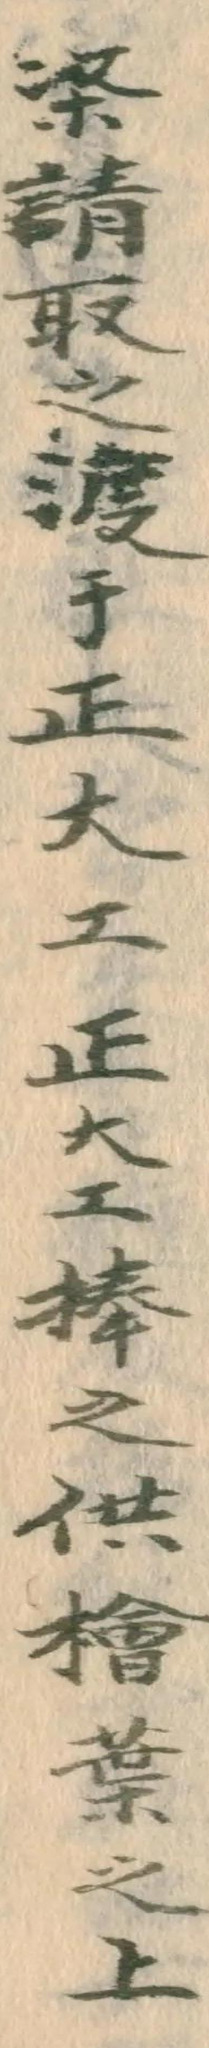梁請取之渡于正大工正大工捧之供檜葉之上
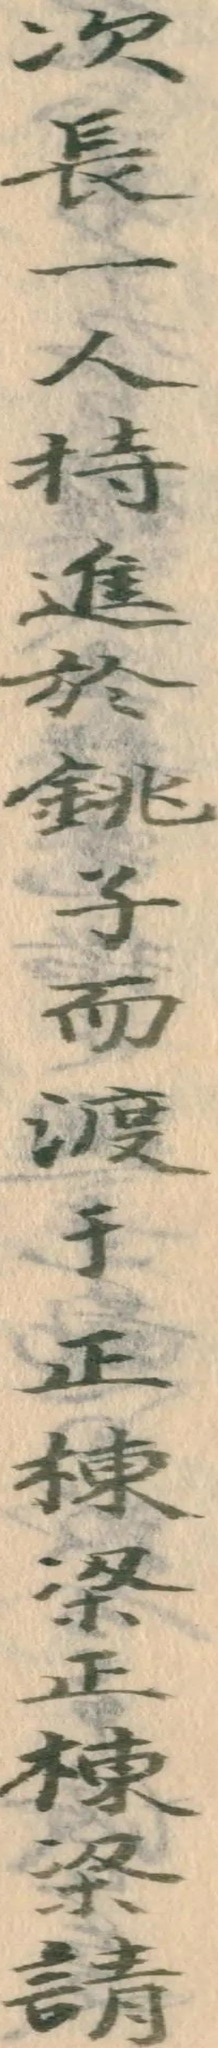次長一人持進於銚子而渡于正棟梁正棟梁請
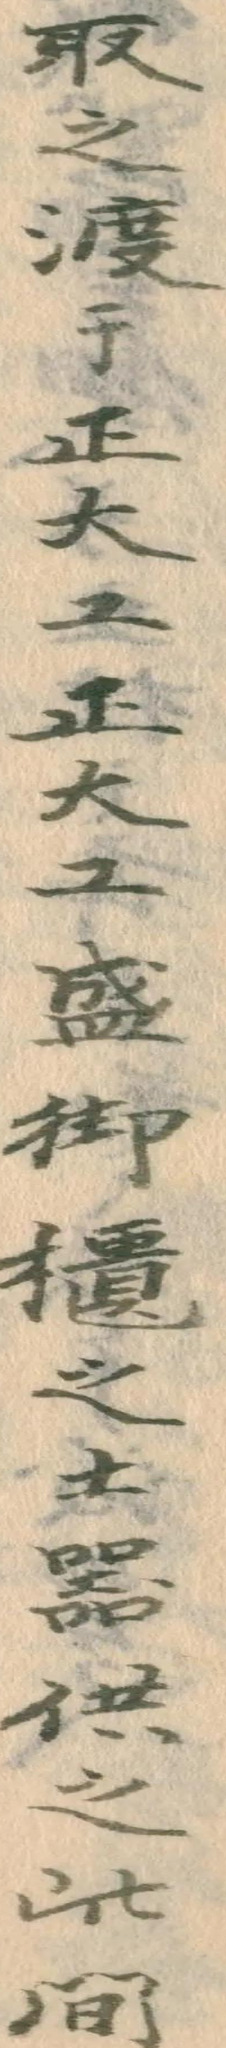取之渡于正大工正大工盛御櫃之土器供之此間
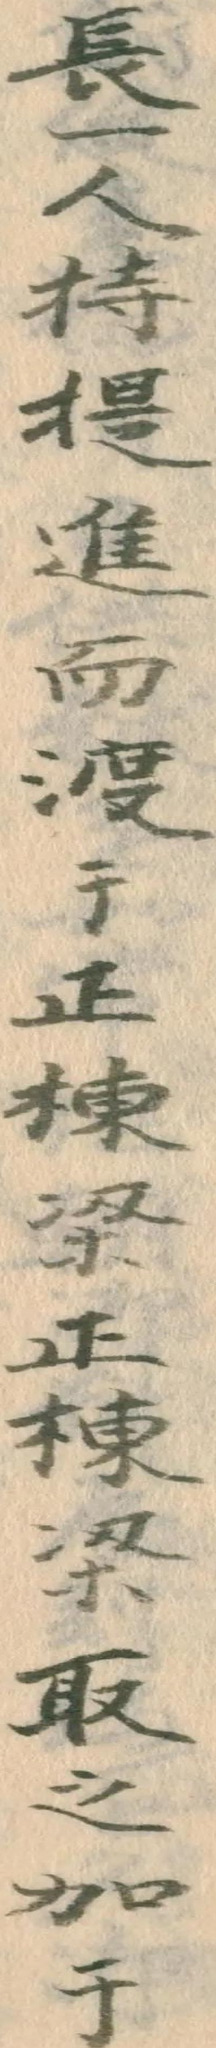長一人持提進而渡于正棟梁正棟梁取之加于
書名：賀茂社記録. 第17冊
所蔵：国立国会図書館 National Diet Library, JAPAN
